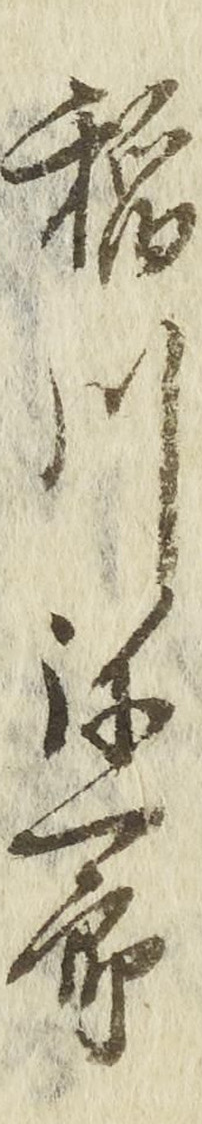稲川弥一郎
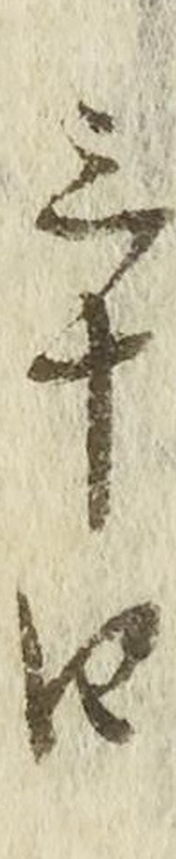三十四
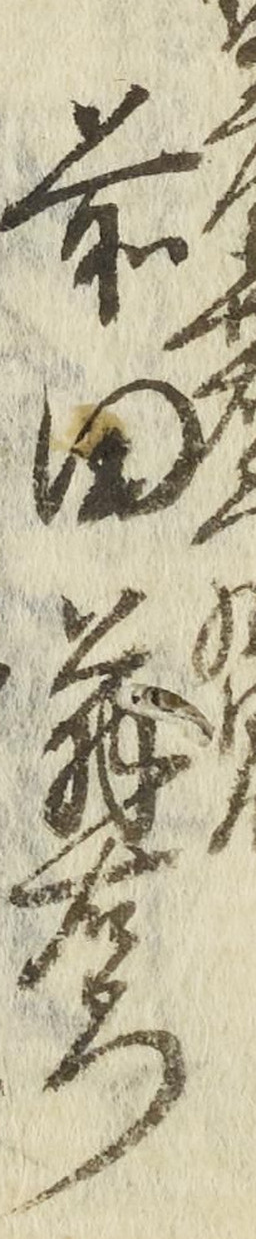前田藤右衛門
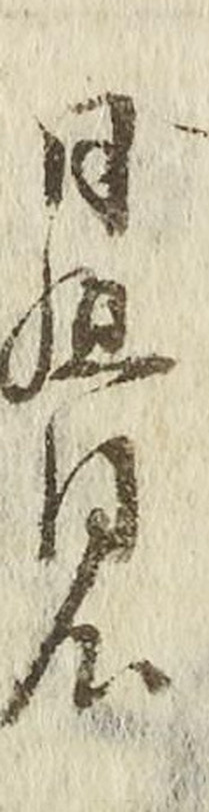同組同心
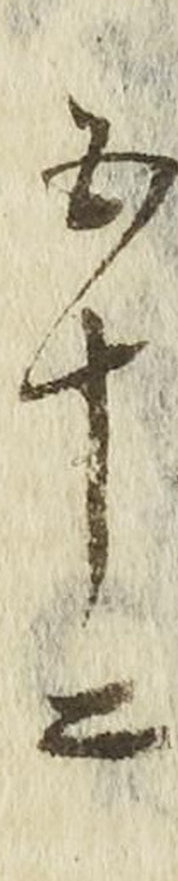五十二
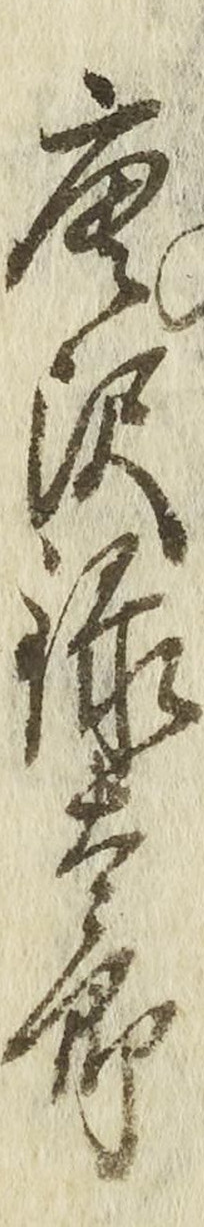唐沢録太郎
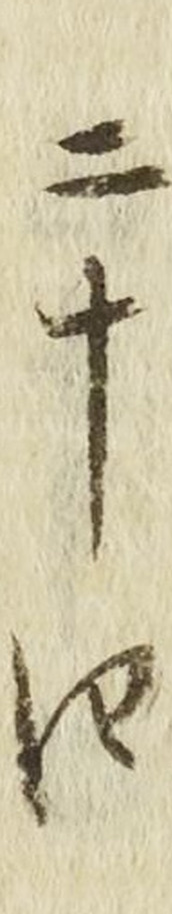二十四
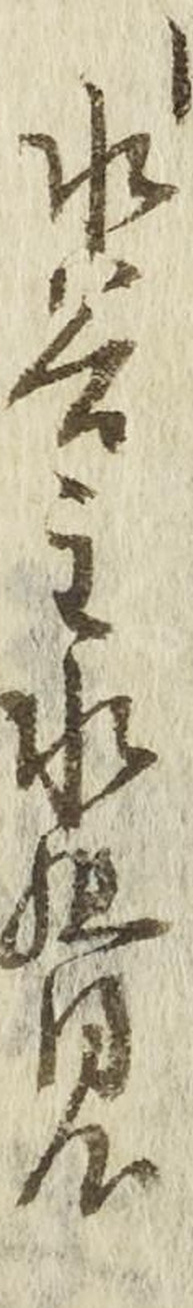水谷主水組同心
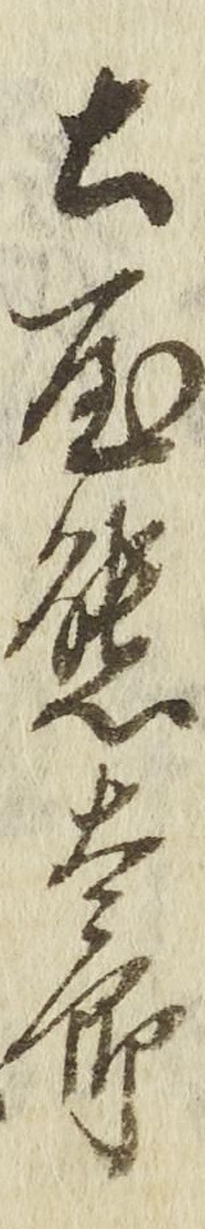土屋熊太郎
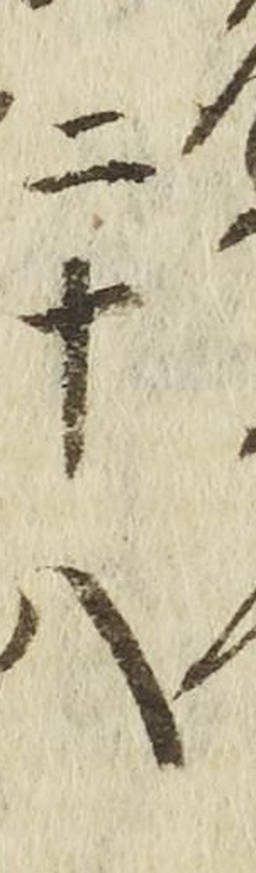二十八
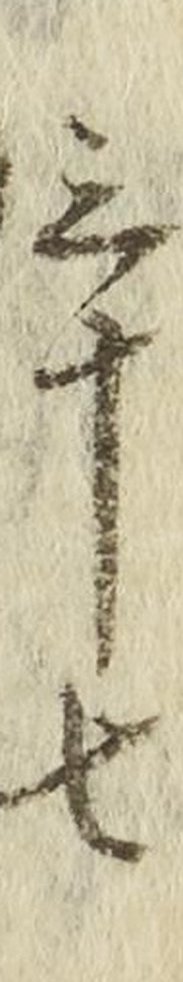三十七
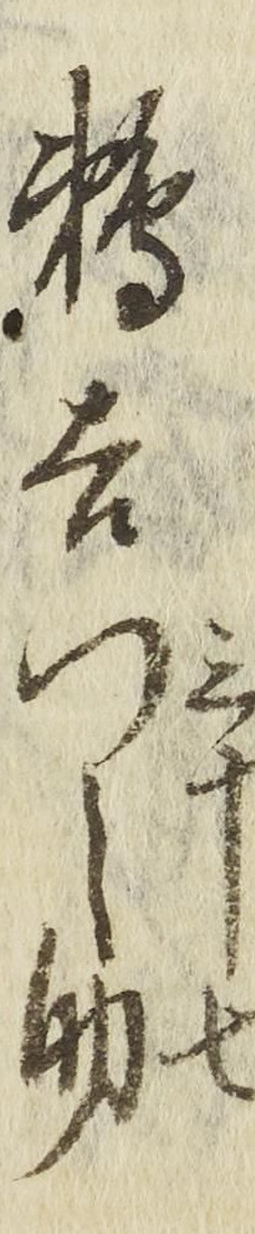鵜吉門之助
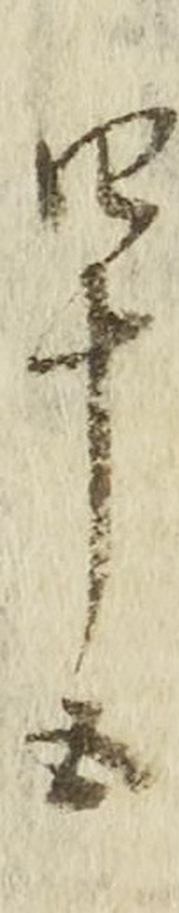四十五
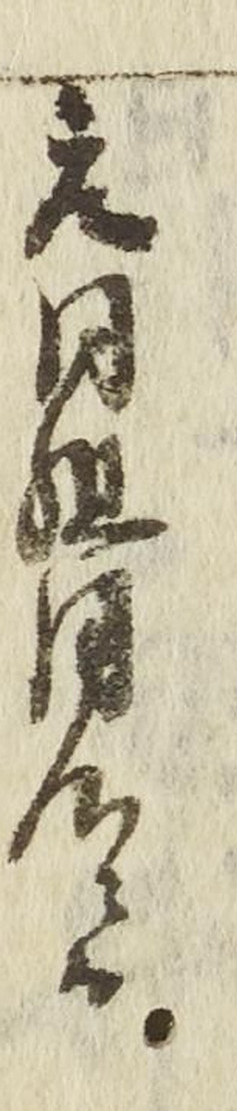元同組同心二而
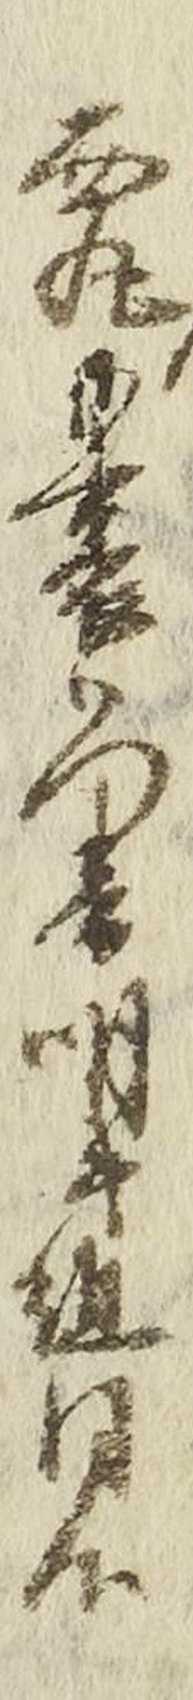当時西丸御裏御門番明キ組同心
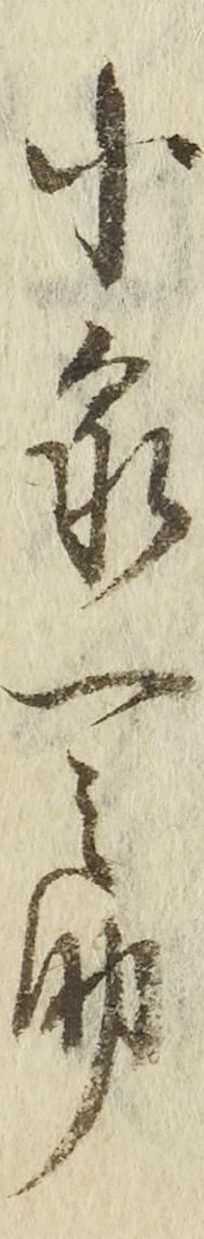小泉一之助
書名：世説ヤンレフシ写、駿州田中城地震ニ付内外破損御届書、豫州大洲城地震ニ付内外破損御届書・封廻状
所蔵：東京大学地震研究所図書室 Earthquake Research Institute Library, The University of Tokyo, JAPAN
